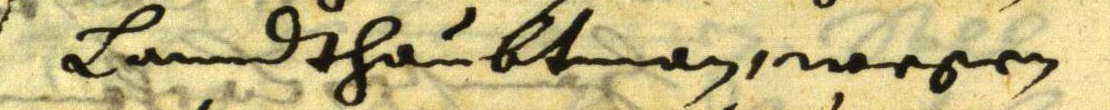Lanndthaūbtman, wegen
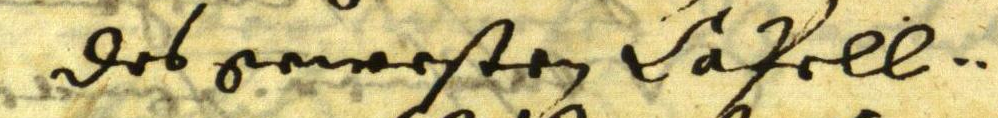des gewesten CaPell¬
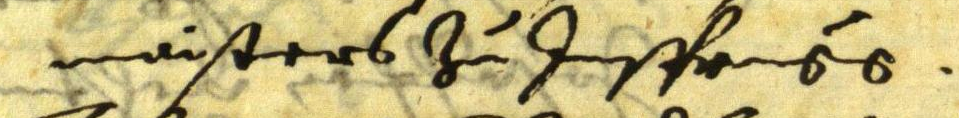maisters Zū InsPrūgg.
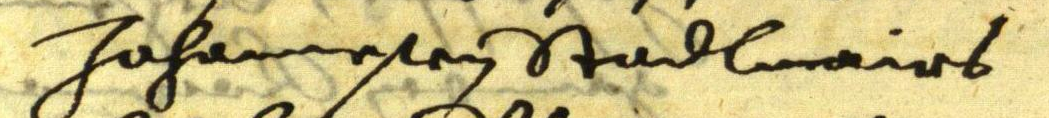Johannsen Stadlmairs
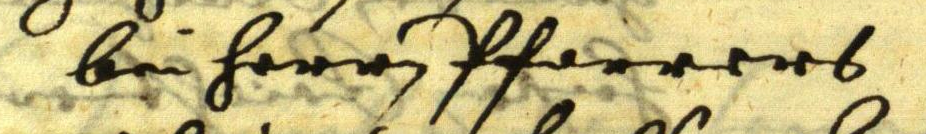bei herrn Pfarrers
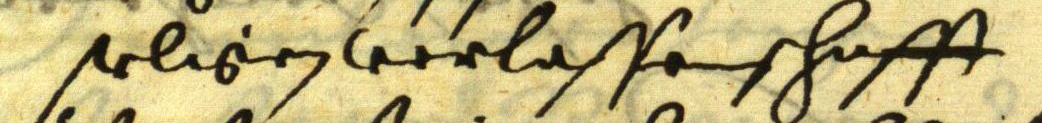seligen verlassenschafft
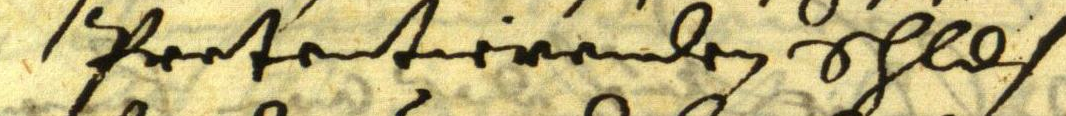Pretentierenden Schlds¬
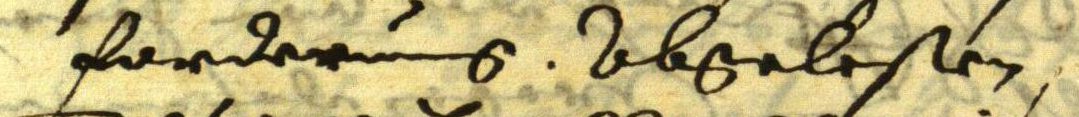forderūng. Abgelesen,
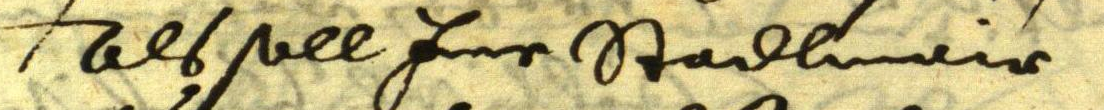Als soll Ime Stadlmair
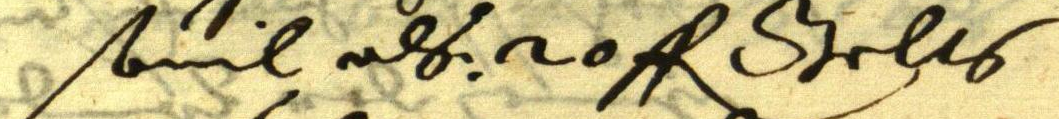soūil als: 20 fl Gelts
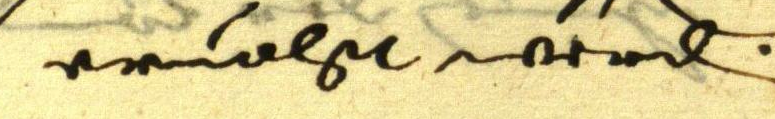erūolgt werd.
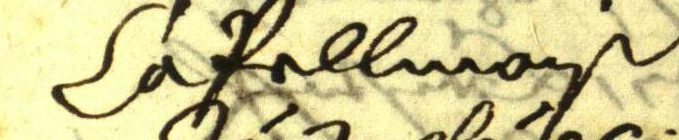CaPellmaist
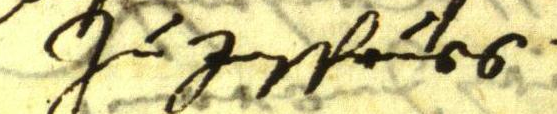Zū InsPrūgg.
